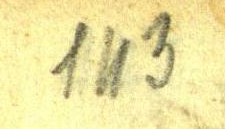143
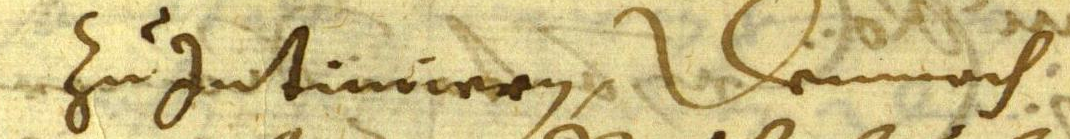Zū Intimiern, Demnach
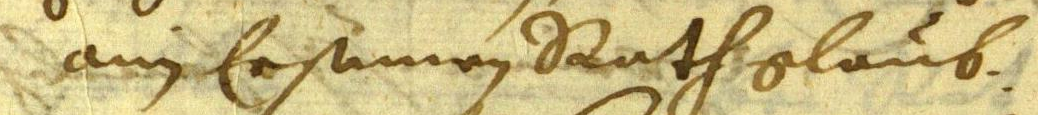aim Ersamen Rath glaūb¬
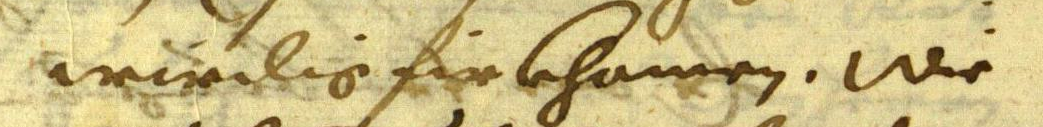wirdig fir khomen. Wie
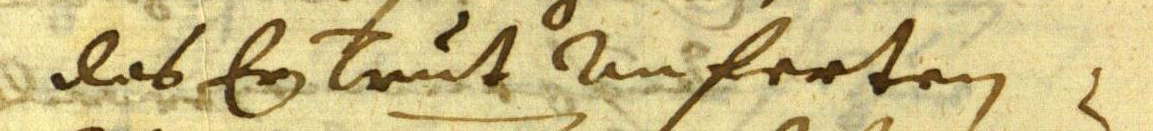das Er Trūt Anferten
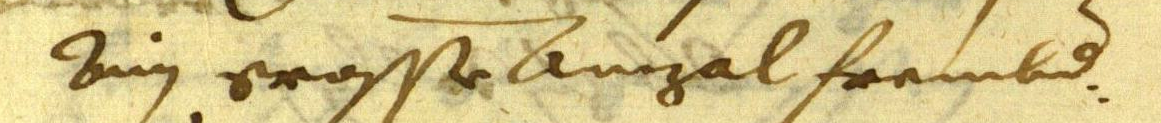Ain grosse Anzal frembd:
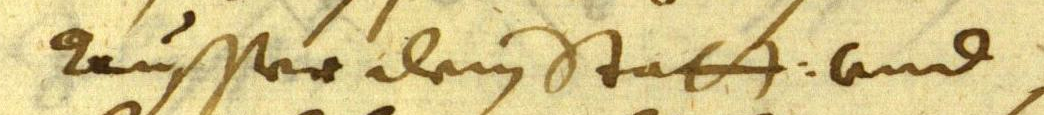Aūsser dem Statt: vnd
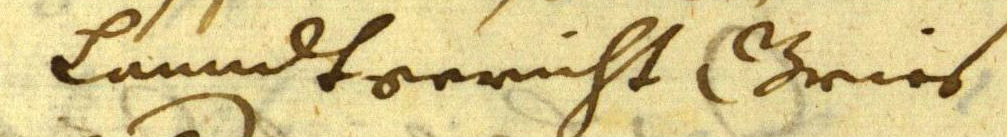Lanndtgericht Gries
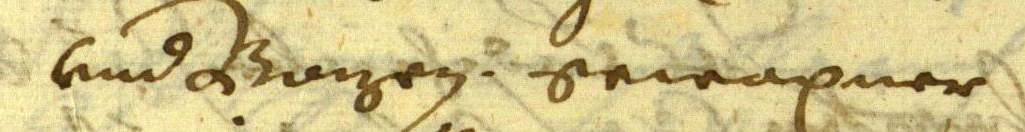vnd Bozen. gewaxner
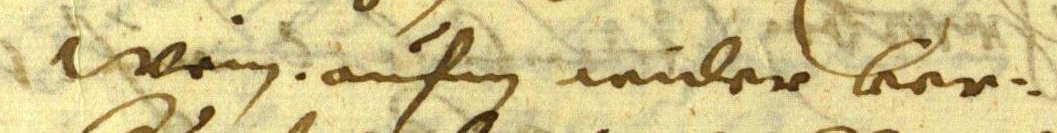Wein. aūfm wider ver¬
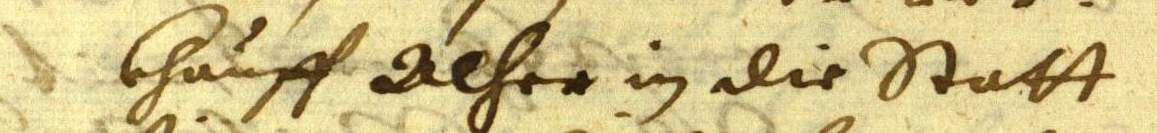khaūff Alher in die Statt
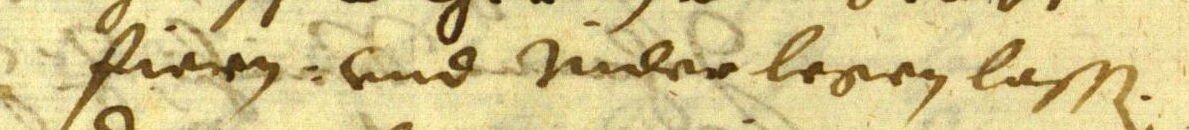fiern: vnd nider legen lass.
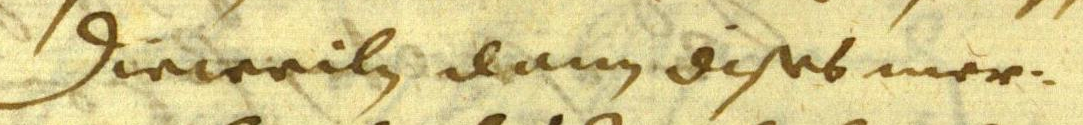Dieweiln dann dises mer¬
